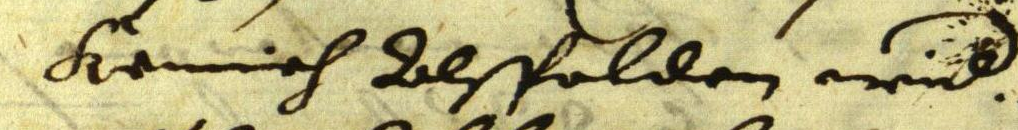Kemich Abspalden wid¬
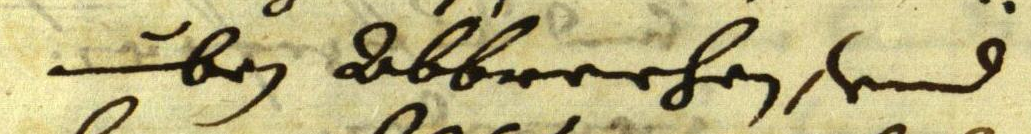ūmben Abbrechen, vnd
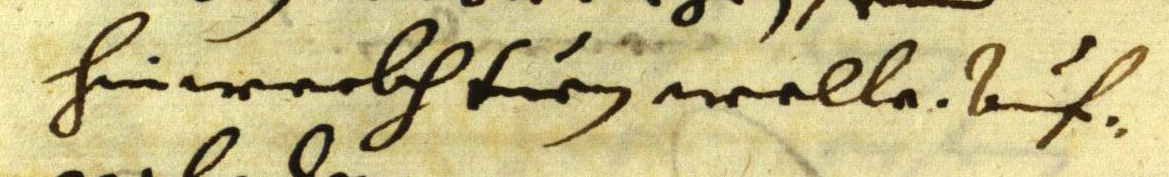hinweckh tūen welle. Aūf¬
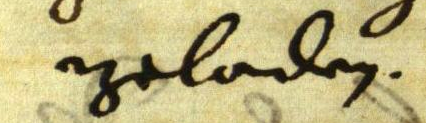zeladen.
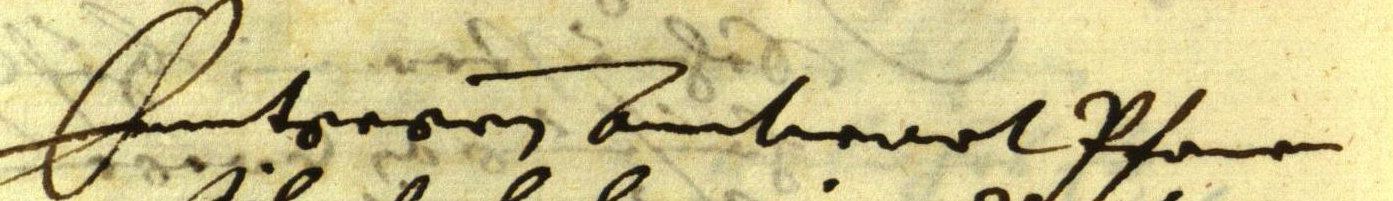Enntgegen Anntwort Pfannen¬
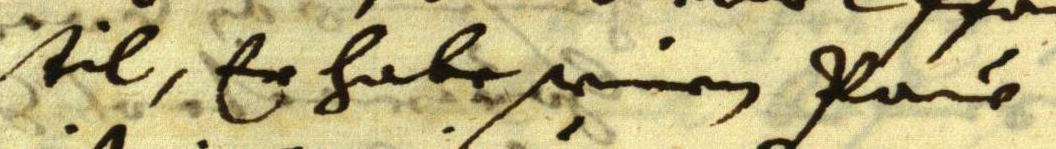stil, Er habe seinen Paw̄
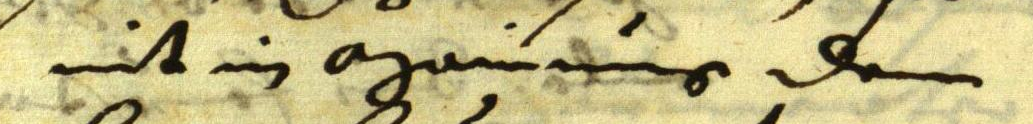nit in Mainūng denn
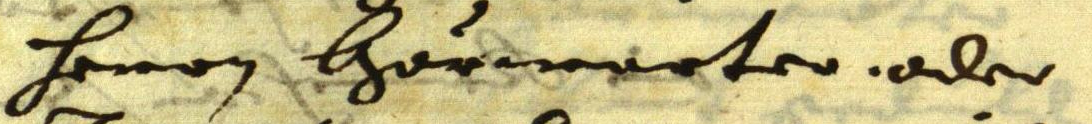herrn Hōrwarter. oder
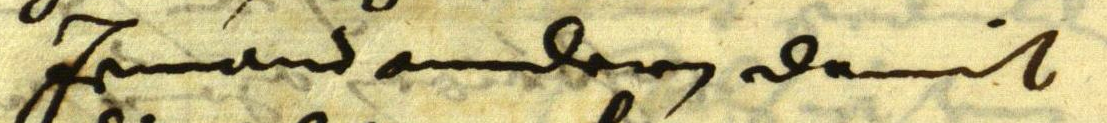Jemand anndern damit
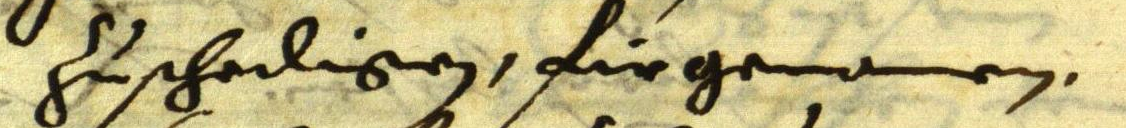Zū schedigen, firgenomen
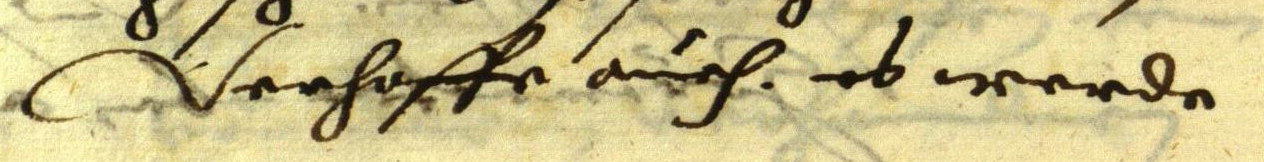Verhoffe aūch. es werde
